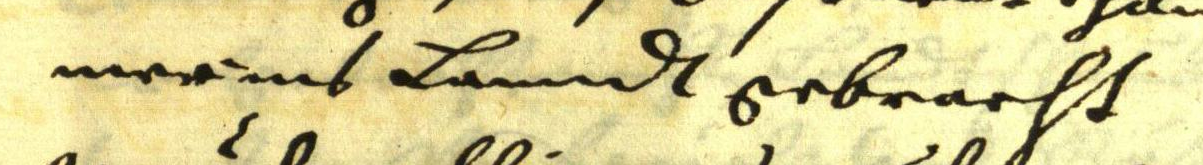mer ins Lanndt gebracht
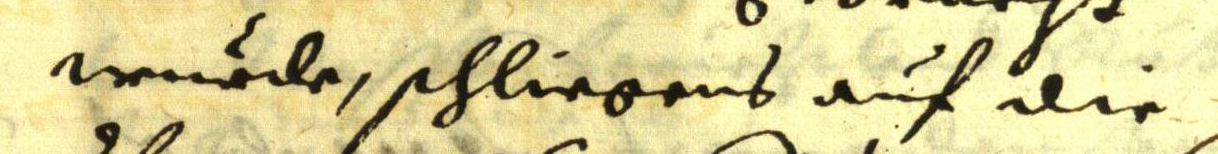wūrde, schliegens aūf die
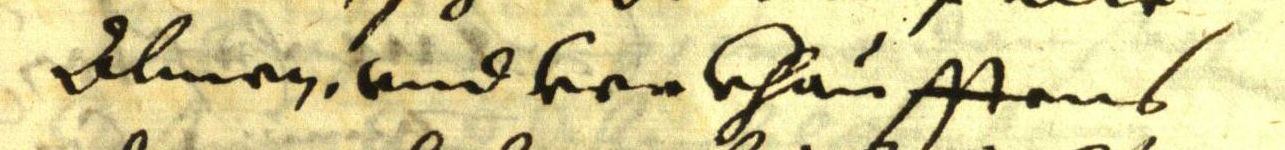Almen. vnd verkhaūffens
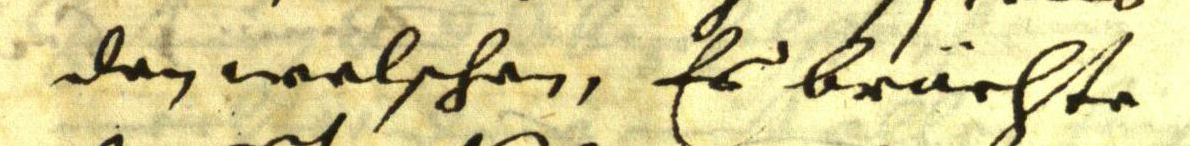den welschen, Es brächte
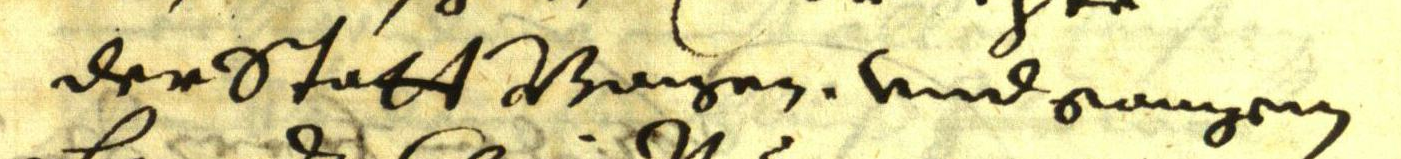der Statt Bozen. vnd gannzen
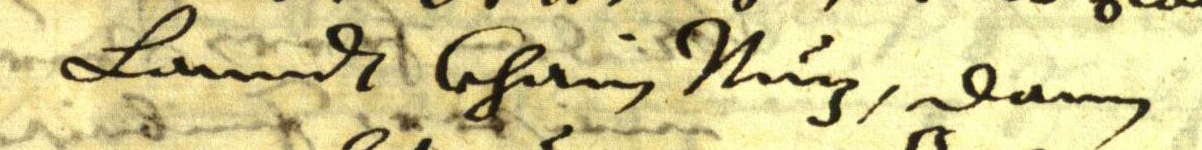Lanndt khain Nūz, dann
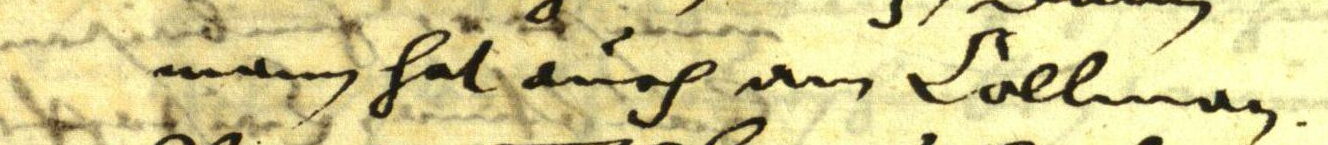mann hat aūch an Collman.
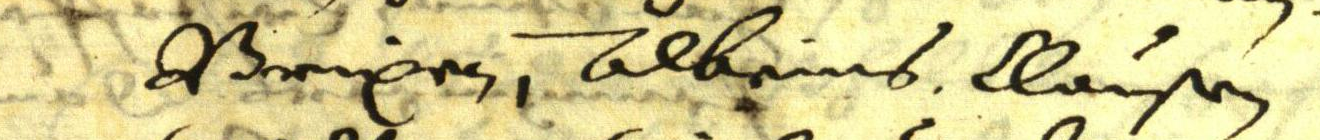Brixen, Albeins. Claūsen
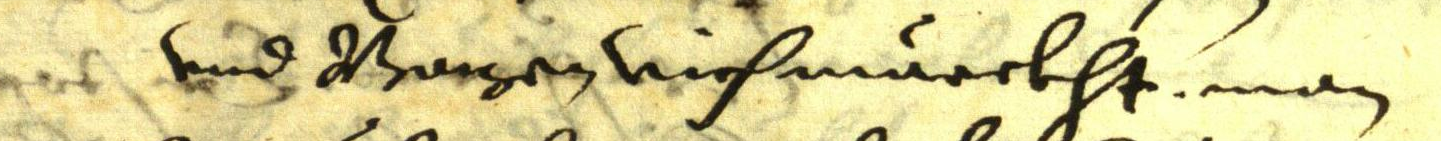vnd Bozen viehmārckht. man
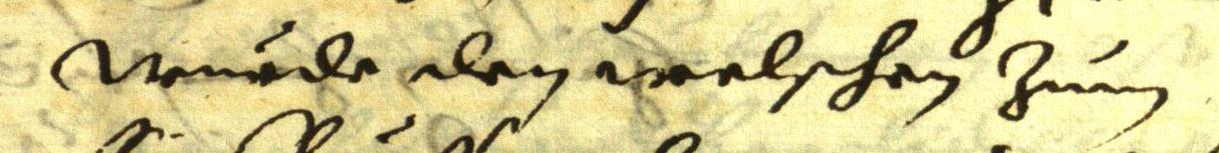wūrde den welschen Zūm
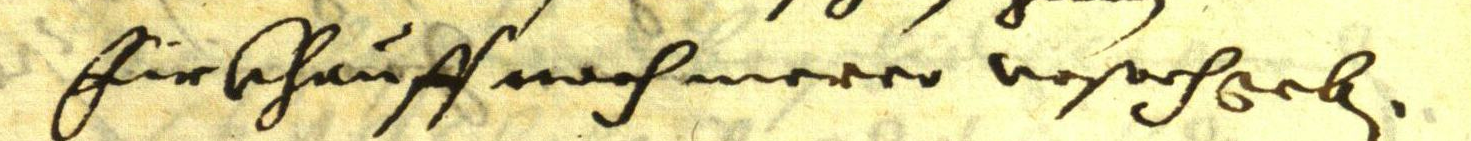Firkhaūff noch merer vrsach geb.
